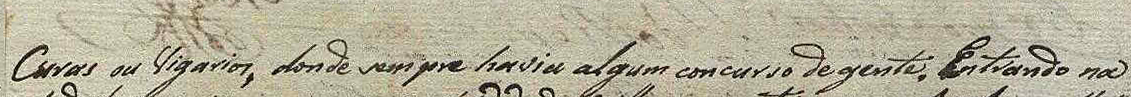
Curas ou Vigarios, donde sempre havia algum concurso de gente. Entrando na
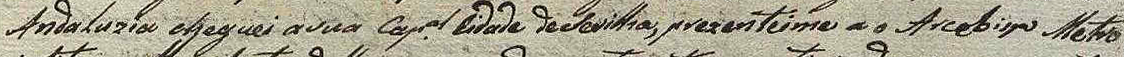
Andaluzia cheguei a sua Cap.al Cidade de sevilha, prezenteime ao Arcebispo Metro
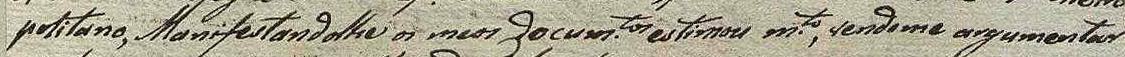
politano, Manifestandolhe os meos docum.tos estimou m.to, vendome argumentar
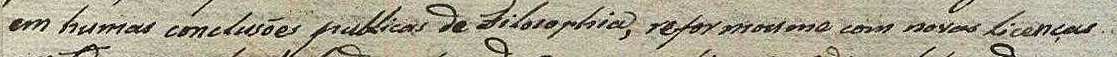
em humas conclusões publicas de Filosophia, reformoume com novas Licenças.
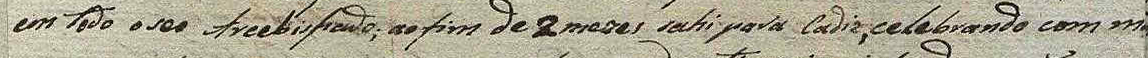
em todo o seo Arcebispado; ao fim de 2 mezes sahi para cadiz, celebrando com m
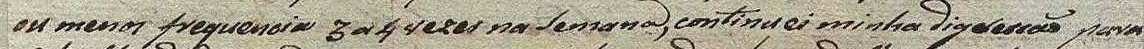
ou menos frequencia 3 a 4 vezes na semana, continuei minha digressaõ para
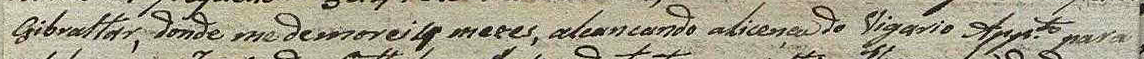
Gibraltar, donde me demorei 4 mezes, alcançando a licença do Vigario App.to para
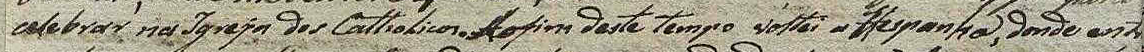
celebrar na Igreja dos Catholicos. Ao fim deste tempo voltei a Hespanha, donde entr
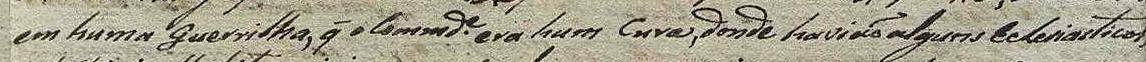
em huma Guerrilha, q̄ o Commd.e era hum Cura, donde haviaõ alguns Eclesiasticos,
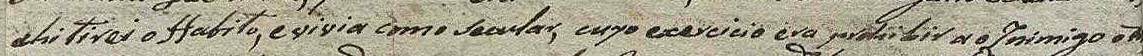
ahi tirei o Habito, e vivia como secular, cuyo exercicio era prohibir ao Jnimigo o
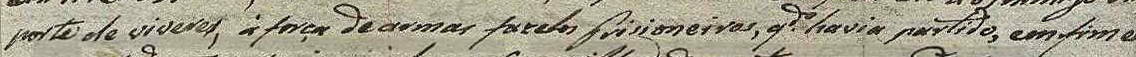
porte de viveres, à força de armas fazelos prisioneiros, q.do havia partido, emfime
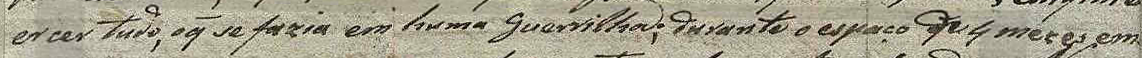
ercer tudo, o q̄ se fazia em huma Guerrilha; durante o espaço de 4 mezes, em
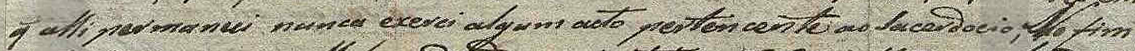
q̄ alli permaneci nunca exerci algum acto pertencente ao sacerdocio, No fim
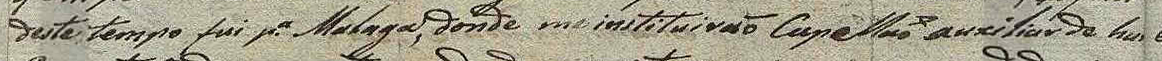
deste tempo fui p.a Malaga, donde me instituiraõ Capellaõ auxiliar de hu
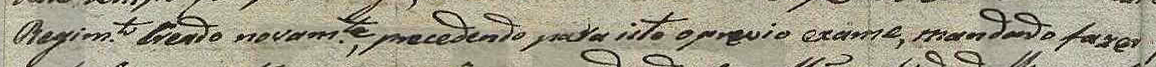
Regim.to creado novam.te, precedendo para isto o previo exame, mandado fazer,
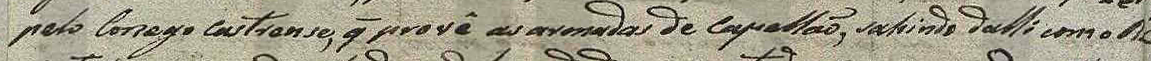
pelo Conego castrense, q̄ provê as armadas de capellaõ, sahindo dalli com o R
